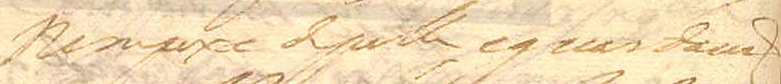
nem pexe de pelle, e guardauaõ
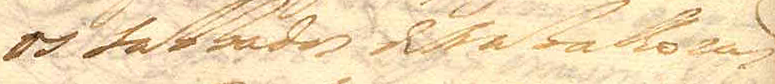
os sabbados de trabalho ves
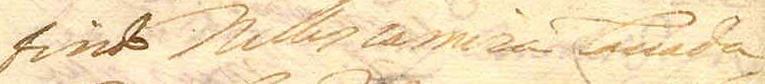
tindo nelles camiza Lauada
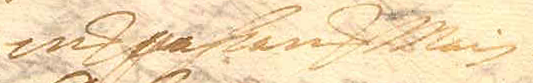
e nã passaraõ mais
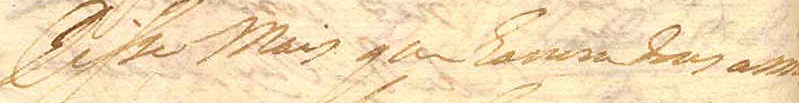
Disse Mais que havera dous ann
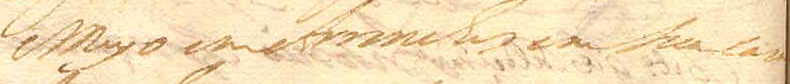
e meyo em Arronches em sua caza
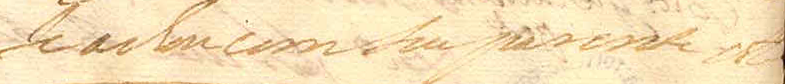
se achou com sua parente
